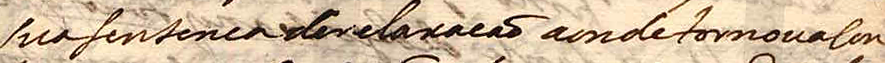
sua sentenca de relaxacaõ aonde tornou a con
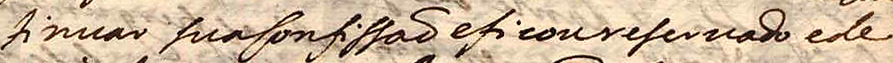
tinuar sua Confissaõ e ficou reseruado e de
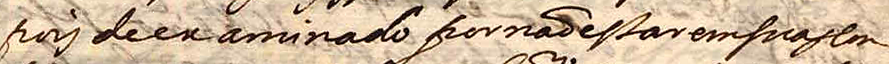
pois de examinado por não estarem suas con
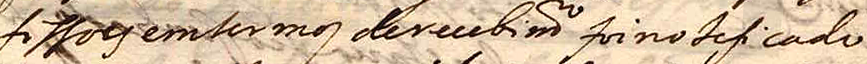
fissoes em termoz de recebimto foi noteficado
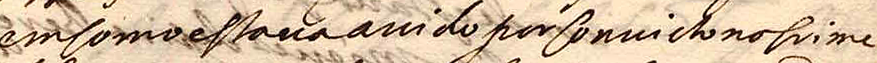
em Como estaua auido por Conuicto no Crime
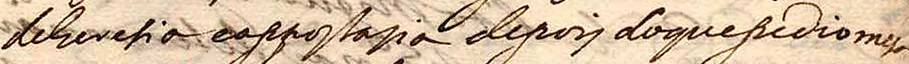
de heresia e appoztazia depois do que pedio mesa
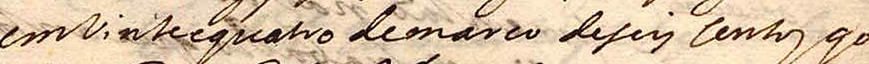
em vinte e quatro de marco de seiscentoz qo
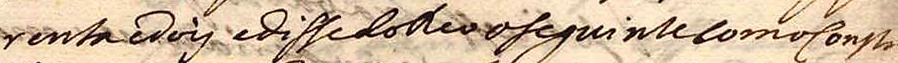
renta e dois e disse do Reo o seguinte como Consta
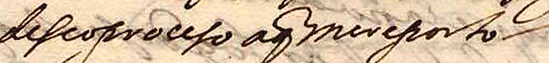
de seo proceso a q̄ me reporto —
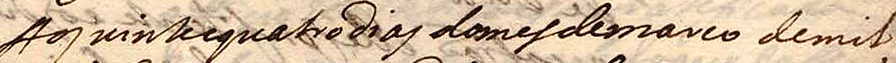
Aoz uinte e quatro dias do mes de marco de mil
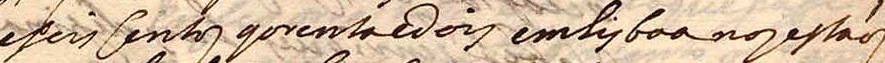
e seisCentoz qorenta e dois em lisboa noz estáoz
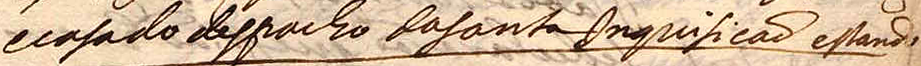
e casa do despacho da santa Jnquisicão estando
